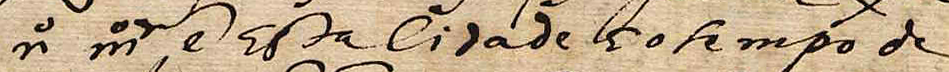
no mor ē Esta cidade E o tempo de
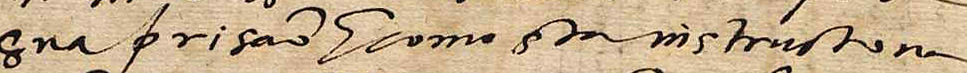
sua prisaõ E como sta instructo na
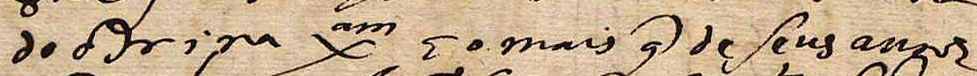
doctrina Xam E o mais q̄ de seus autos
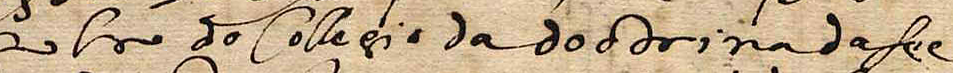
solto do Collegio da doctrina da fee
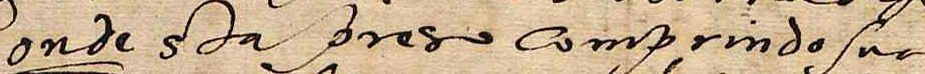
onde sta preso comprindo sua
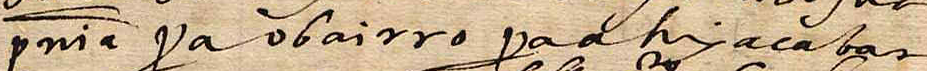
p̄nia ꝑa o bairro ꝑa ahy acabar
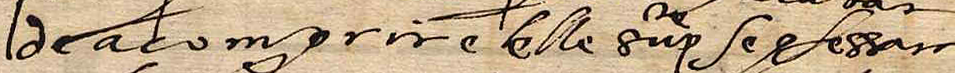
de a comprir e elle supte se ꝯfessara
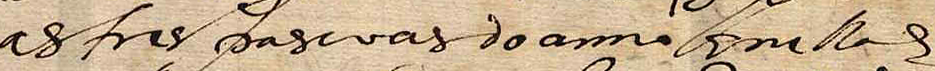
as tres pascoas do anno E nellas
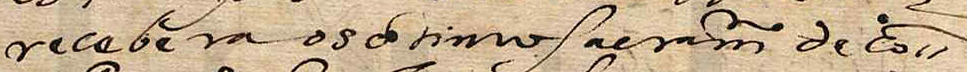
recebera o s_timo Sacramto de cō
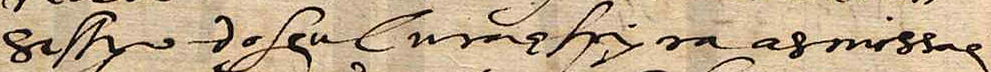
selho do seu Cura E hyra as missas
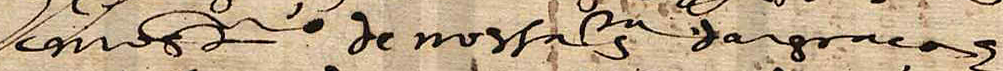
mostro de nossa sra da graça E
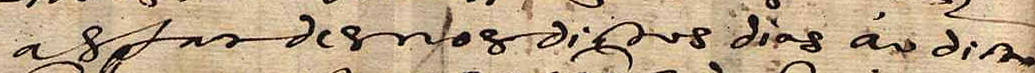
as tardes nos dictos dias ao dicto
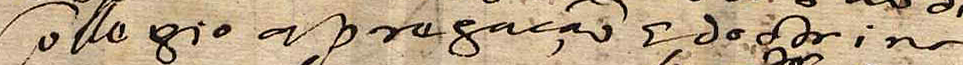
Collegio a pregação E doctrina
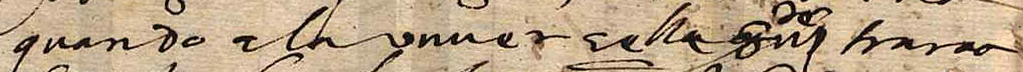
quando ela ouuer E elle supte traraa
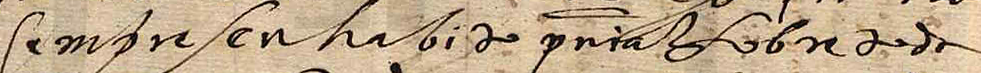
sempre seu habito p̄niaL sobre toda
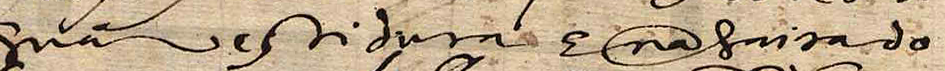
sua vestidura E nā saira do
